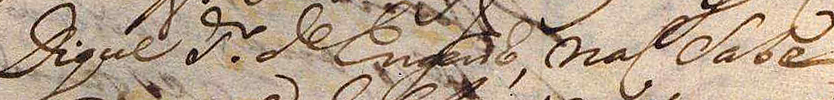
Dique s.r de Engenho, nā sabe
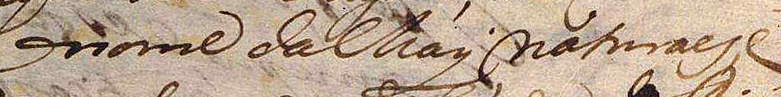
o nome da May naturaes, e
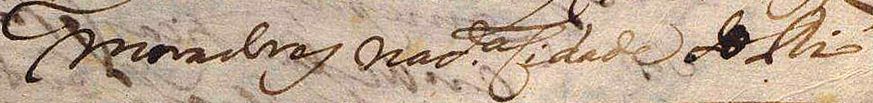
moradores na d̄.a Cidade do Rio
